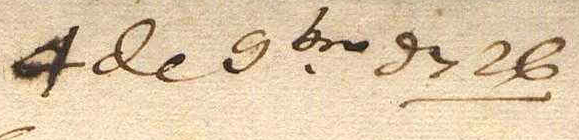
4 de 9.bro d̄ 726
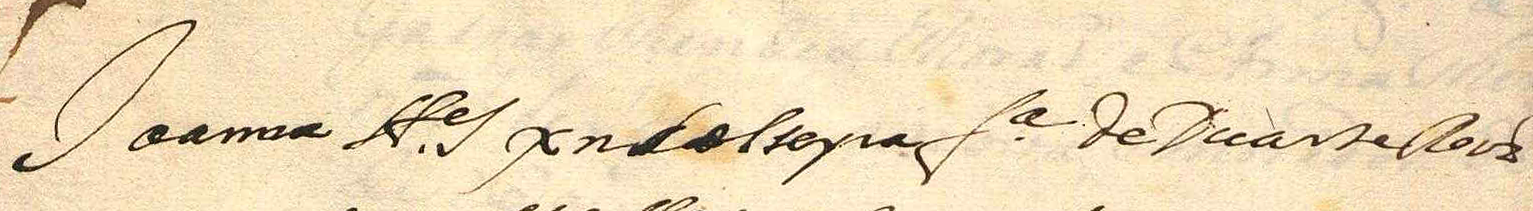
Ioanna H.es x n solteyra f.a de Duarte Roiz̄
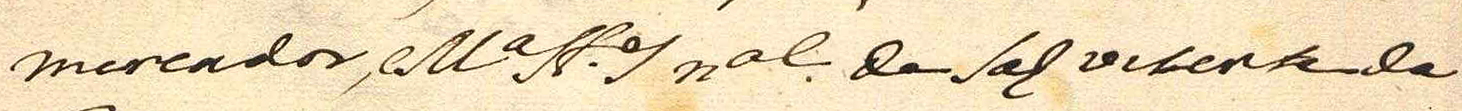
mercador, Ma H.es nal. de saõ visente da
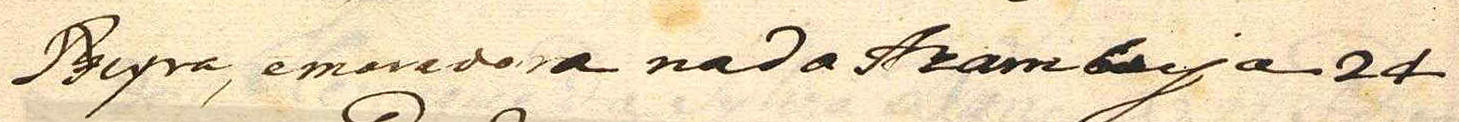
Beyra, e moradora na da Azambuja 24
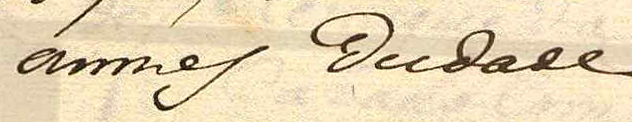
annos de idade
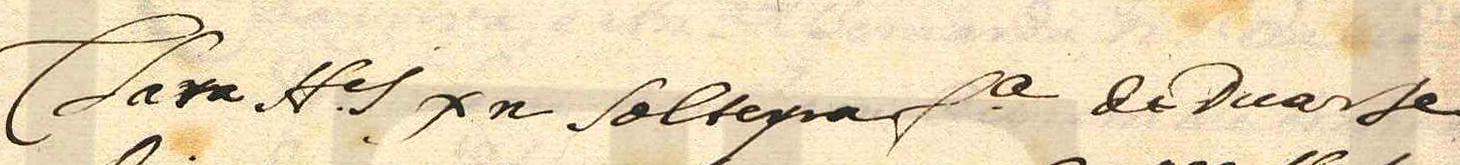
CLara H.es x n solteyra f.a de Duarte
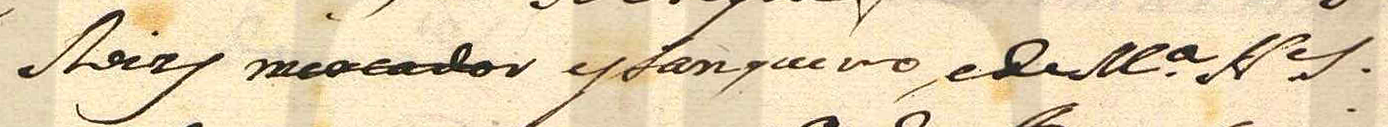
Roizs mercador estanqueiro, e de M.a H.es.
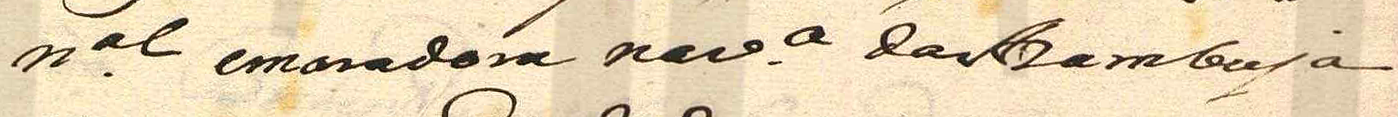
n.al e moradora na v.a da Azambuja
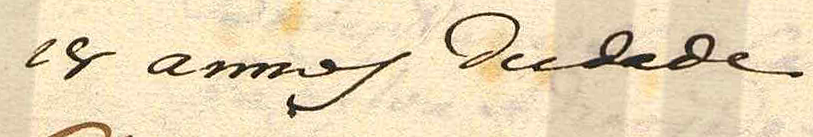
18 annos de idade
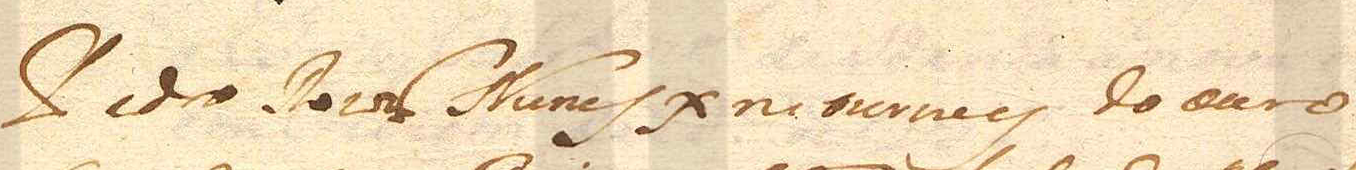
Pedro Roiz̄ Nunes x n e ouriues do ouro
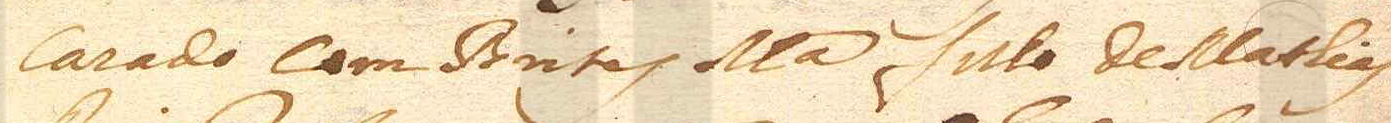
cazado com Brites Ma filho de Mathias
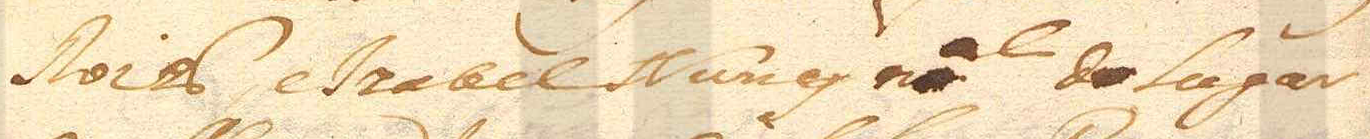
Roiz̄, e Izabel Nunes n_al do Lugar
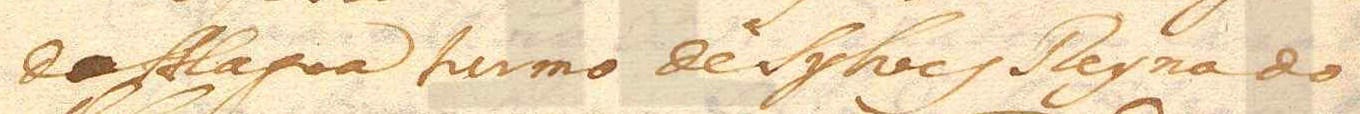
da Alagoa termo de Sylves Reyno do
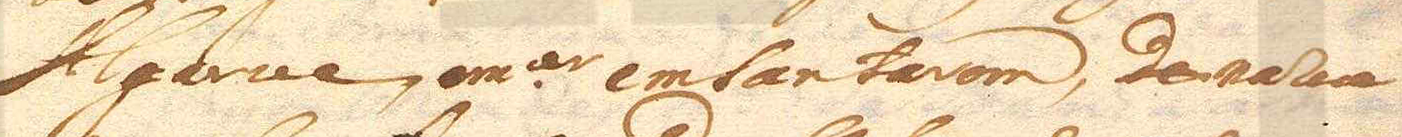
Algarue, e m.or em santarem, de na Rua
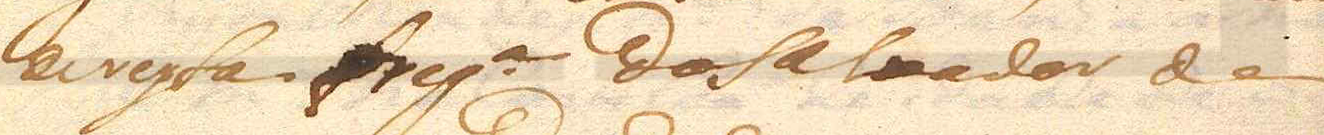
dereyta freg.a do saluador de
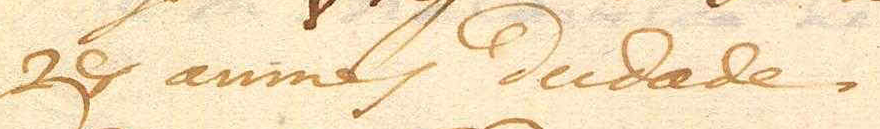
28 annos de idade.
